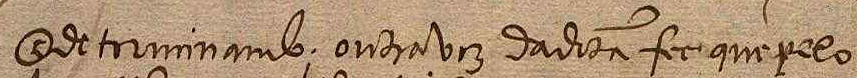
e determinando. outra vez da dita fee que p̄llo
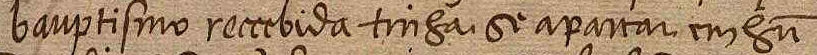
bauptismo recebida tinha se apartar em hū
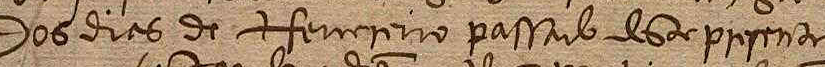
dos dias de feuereiro passado deste presente
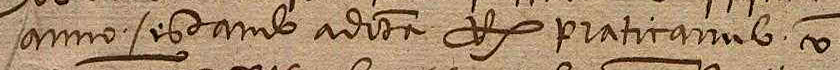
anno ./ estando a dita Rꝭ praticamdo c̄o
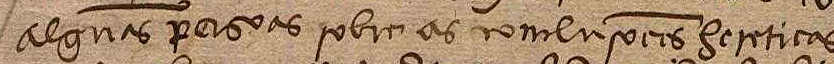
alguās pessoas sobre as conclusõees hereticas
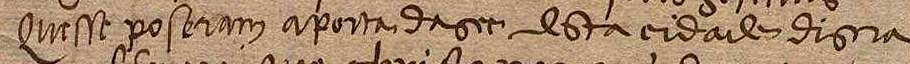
Que sse poseram a porta da see desta cidade disera
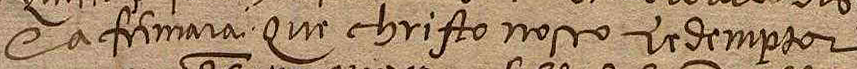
e afirmara. Que christo nosso redemptor
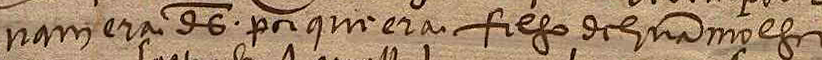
nam era ds̄. porque era filho de huā molher
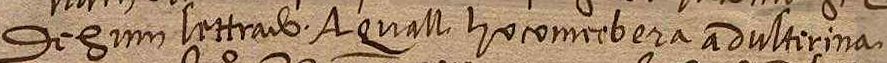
de hum lettrado. A quall ho comcebera adulterina
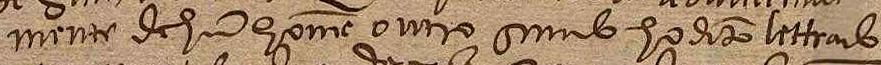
mente de hū homē outro semdo ho dito lettrado
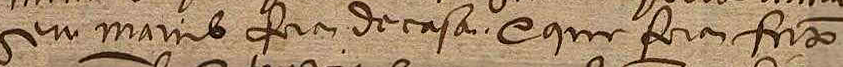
seu marido fora de casa. e que fora feito
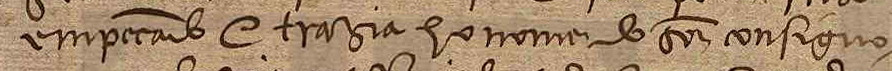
em pec̄ado e trazia ho nome do s̄or consiguo
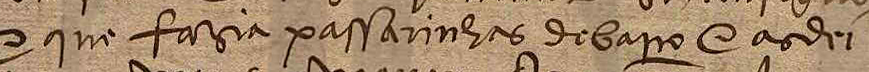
e que fazia passarinhas de barro e as dei
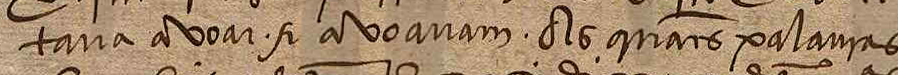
taua a voar . e avoauam. As quaes palauras
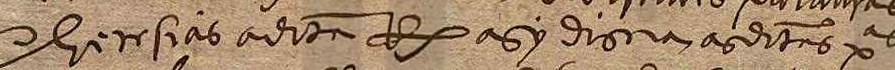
e heresias a dita Rꝭ asy disera as ditas pas
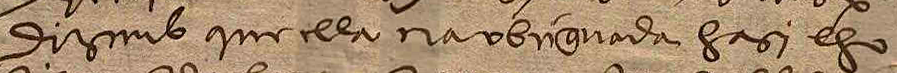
dizendo que ella era obriguada hasy lho
